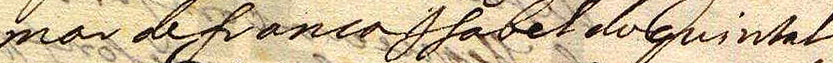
mar de franca Jsabel do quintal
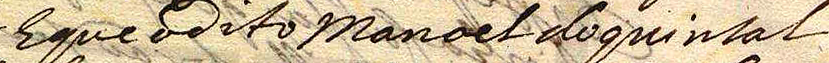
E que o dito Manoel do quintal
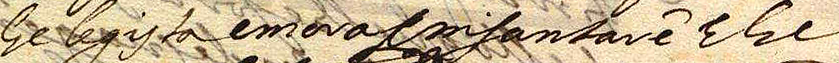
he legista e mora em santarē E he
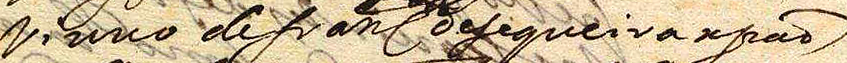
viuuo de franCa de sequeira xpaõ
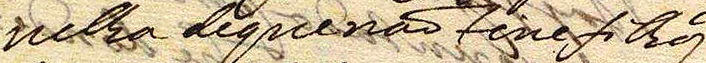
uelha de que naõ teue filhos
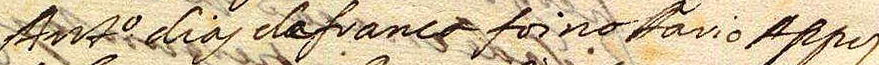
Anto dias de franca foi nottario Appos
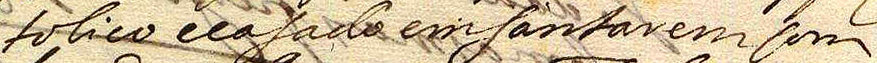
tolico e casado em santarem Com
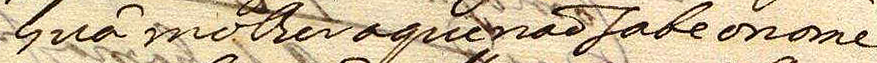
huā molher a que naõ sabe o nome
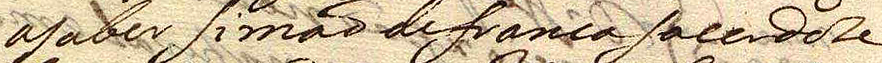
a saber simão de franca sacerdote
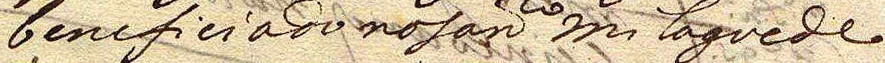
beneficiado no sanro milagre de
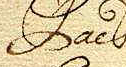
Paes
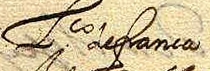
L.co de frança
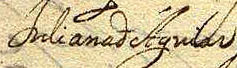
Iuliana de Aguilar
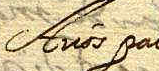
Auós pat.
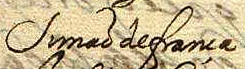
Simaõ de frança
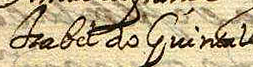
Izabel do Quintal
